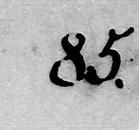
Fr¬
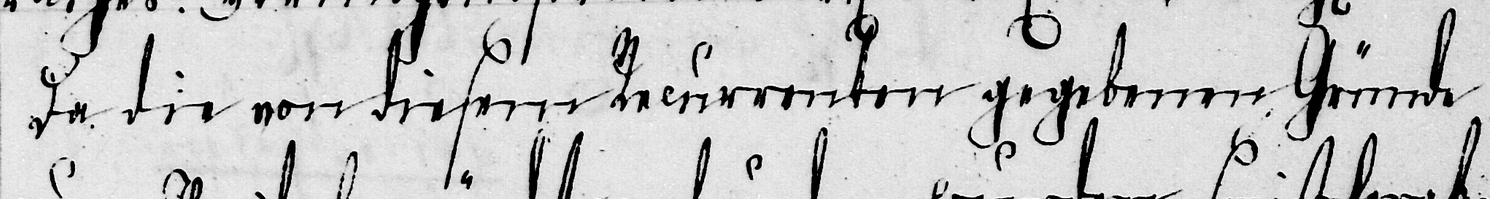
Da die von diesem Recurrenten gegebenen Gründe
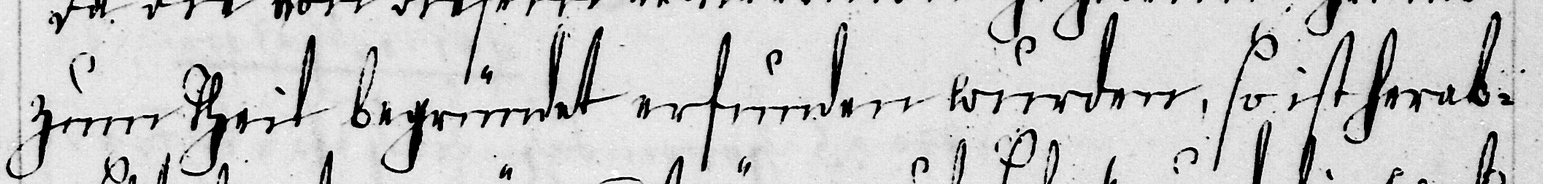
zum Theil begründet erfunden wurden, so ist herab¬
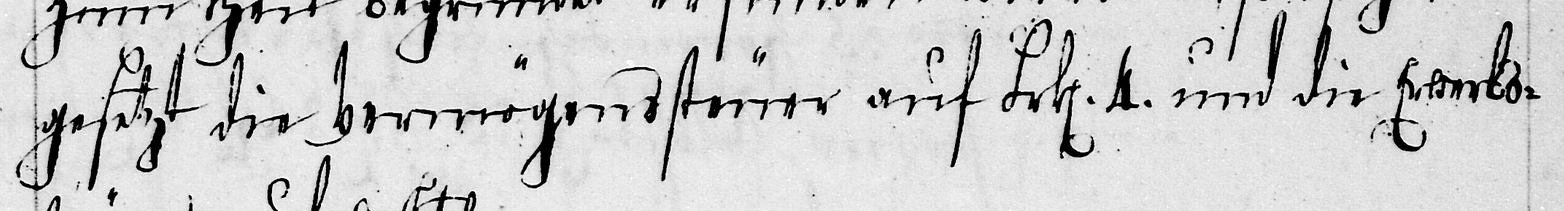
gesetzt die Vermögenssteuer auf Frk[en]. 4. und die
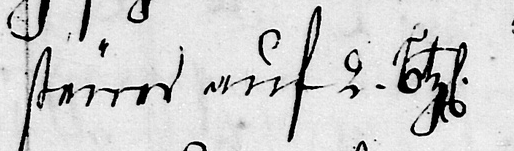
steuer auf 2. Btz[e¬
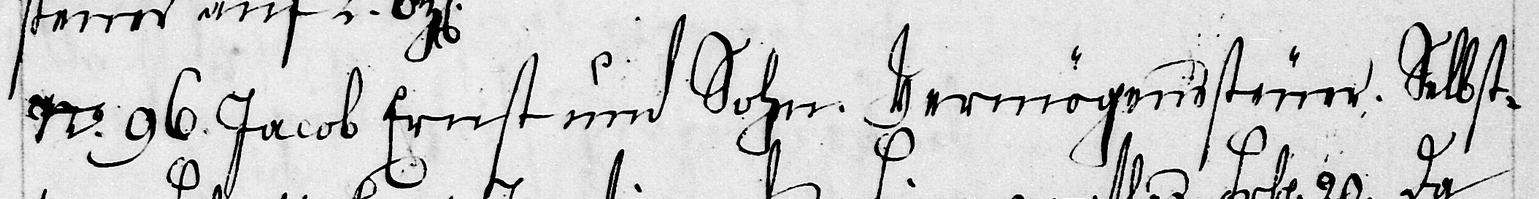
No. 96. Jacob Ernst und Sohn. Vermögenssteuer. Selbst¬
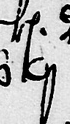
20.
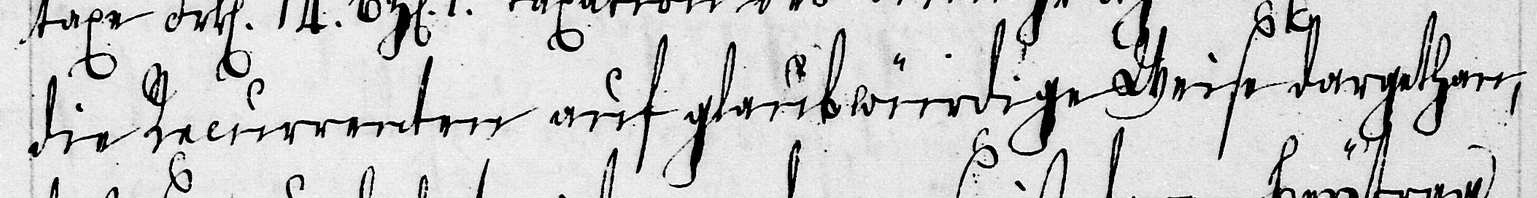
die Recurrenten auf glaubwürdige Weise dargethan,
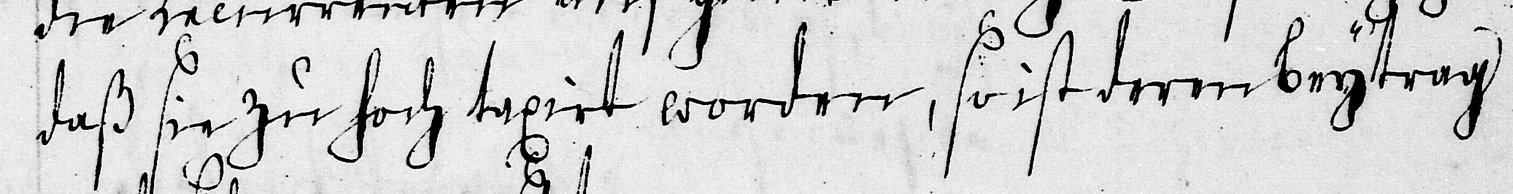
daß sie zu hoch taxirt worden, so ist deren Beytrag
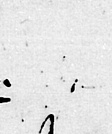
Da
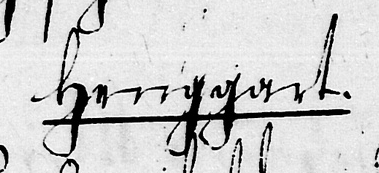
Henggart.
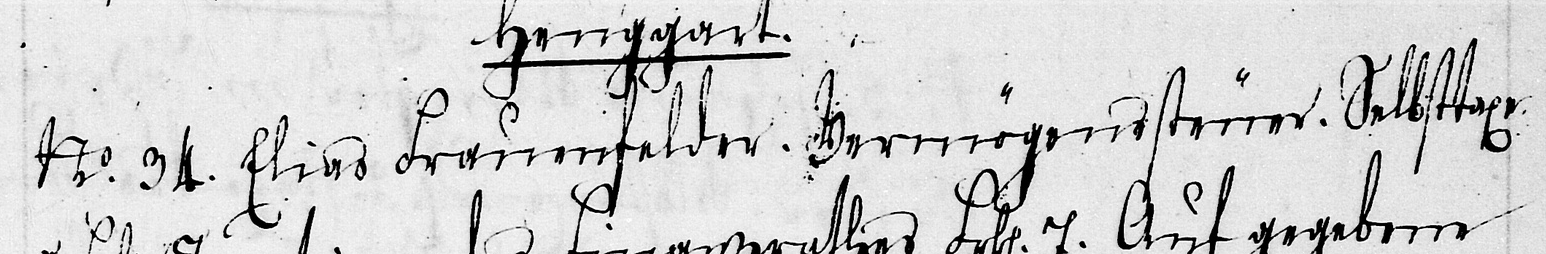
No. 34. Elias Frauenfelder. Vermögenssteuer. Selbsttaxe
